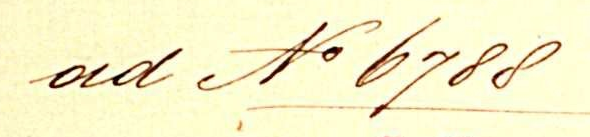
ad No 6788
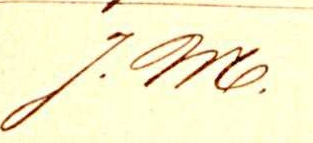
JM
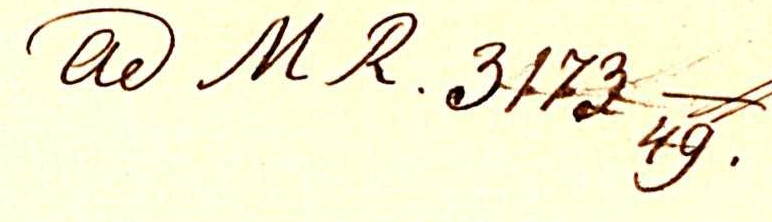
ad MR 3173 49
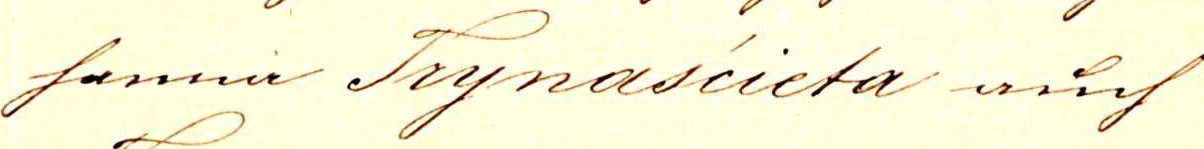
Johanna Trynaścieta auch
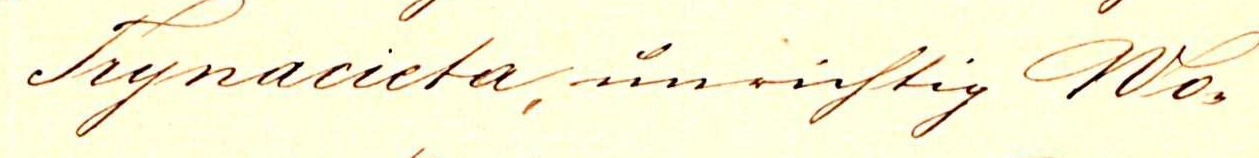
Trynacieta, unrichtig Wo¬
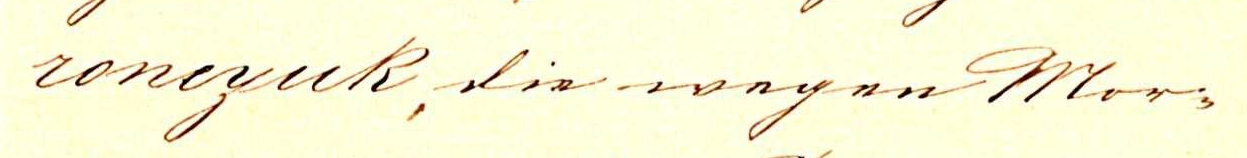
ronczuk, die wegen Mor¬
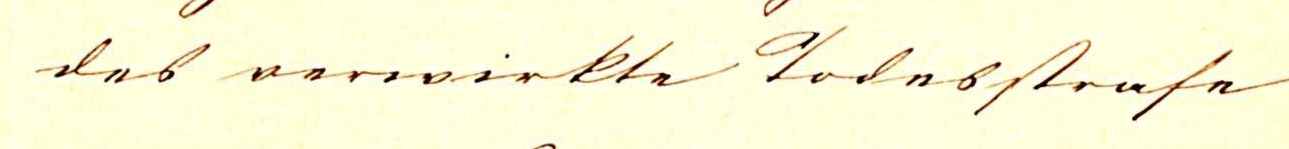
des verwirkte Todesstrafe
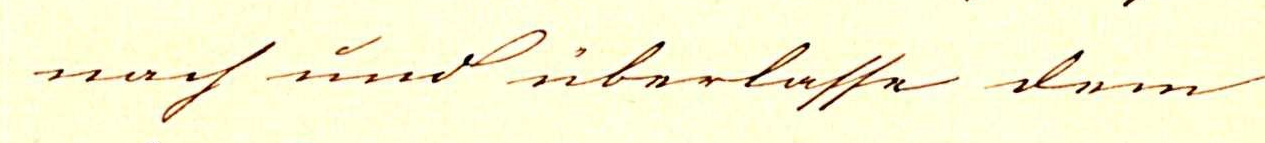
nach, und überlasse dem
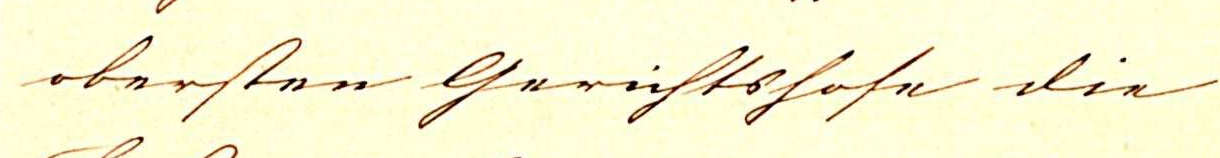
obersten Gerichtshofe die
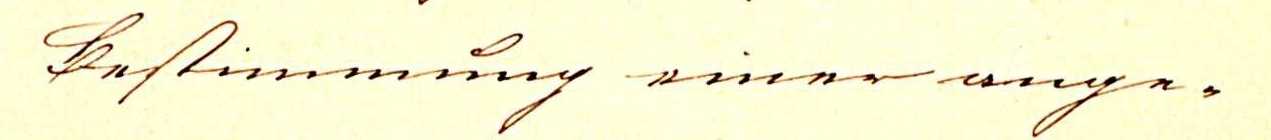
Bestimmung einer ange¬
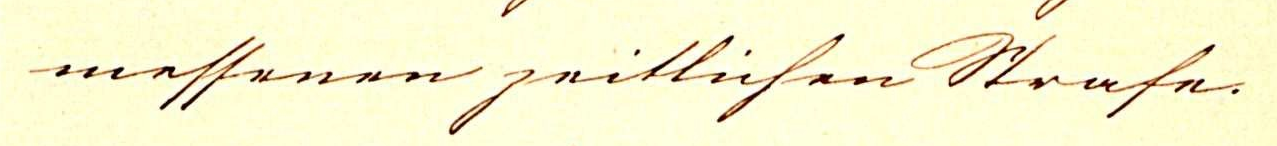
messenen zeitlichen Strafe.
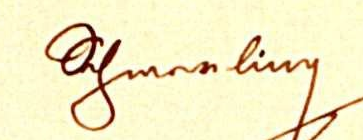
Schmerling
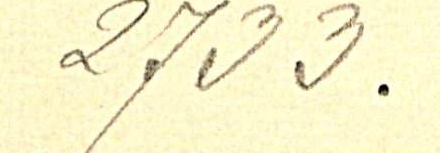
2733.
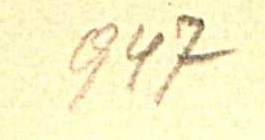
947
